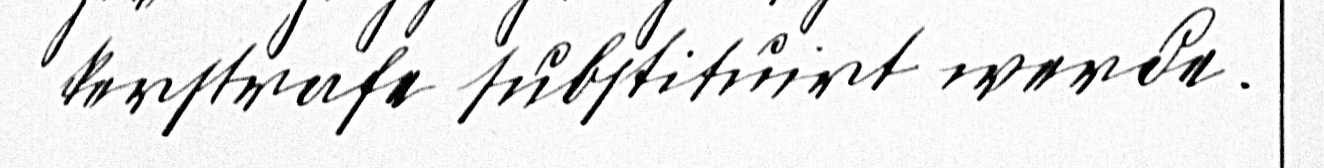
kerstrafe substituirt werde.
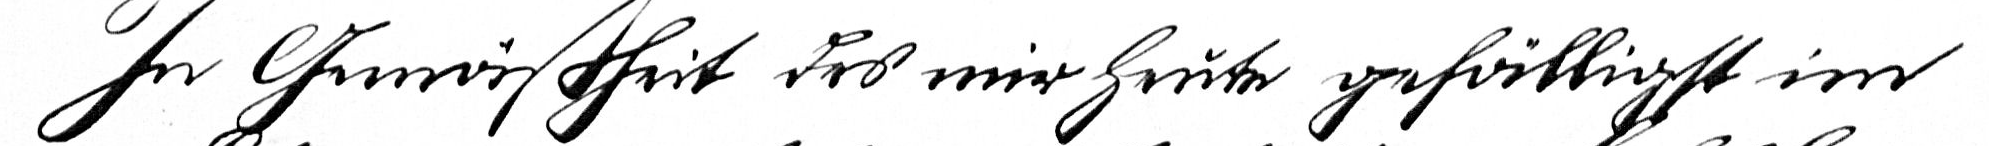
In Gemäxxheit des mir Heute gefälligst im
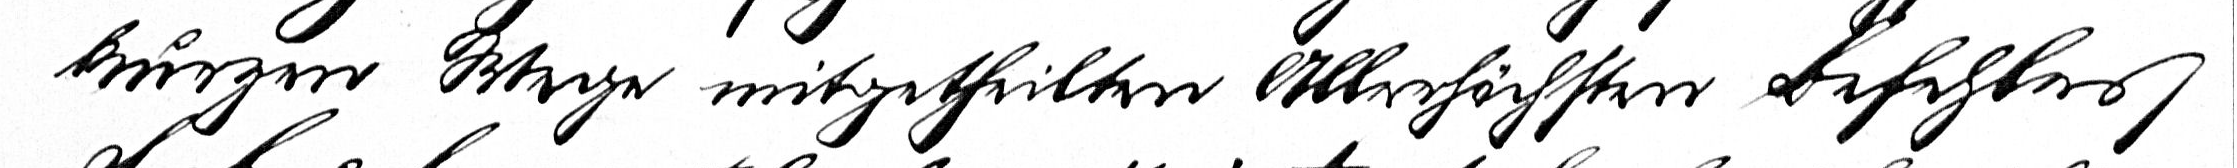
kurzen Wege mitgetheilten Allerhöchsten Befehles
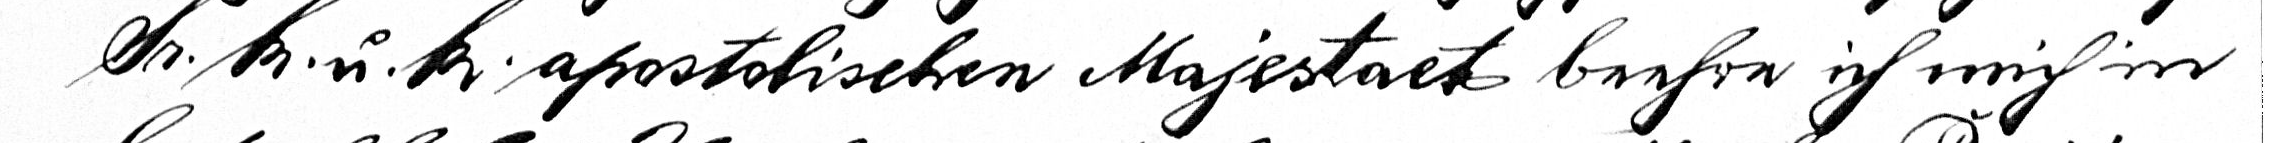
Sr. k. u. k. apostolischen Majestaet beehre ich mich in
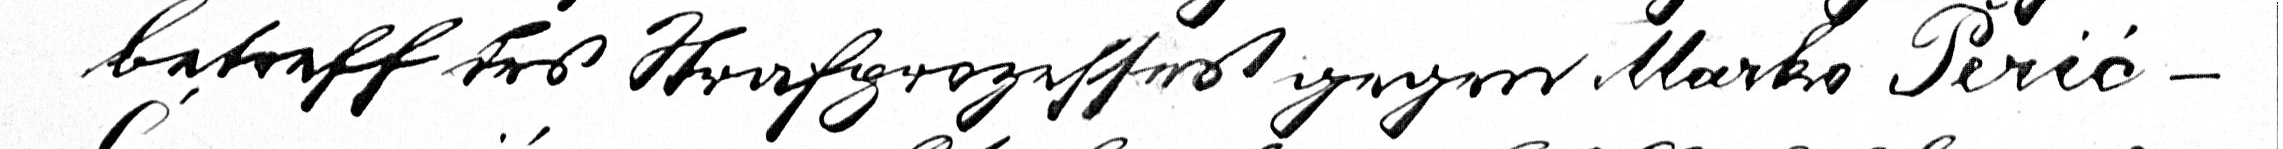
betreff des Strafprozesses gegen Marko Perić -
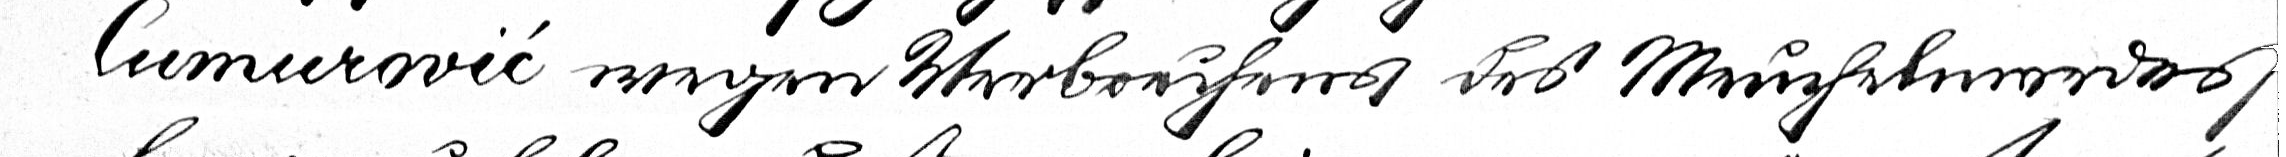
Cumurović wegen Verbrechens des Meuchelmordes,
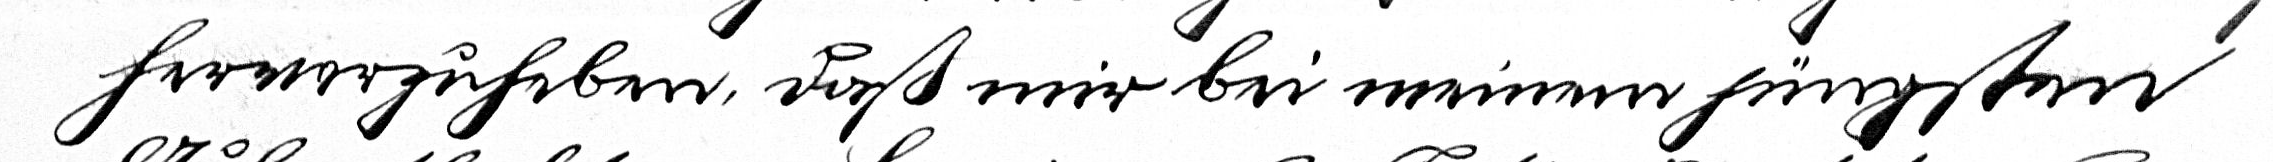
hervorzuheben, daß mir bei meinem jüngsten
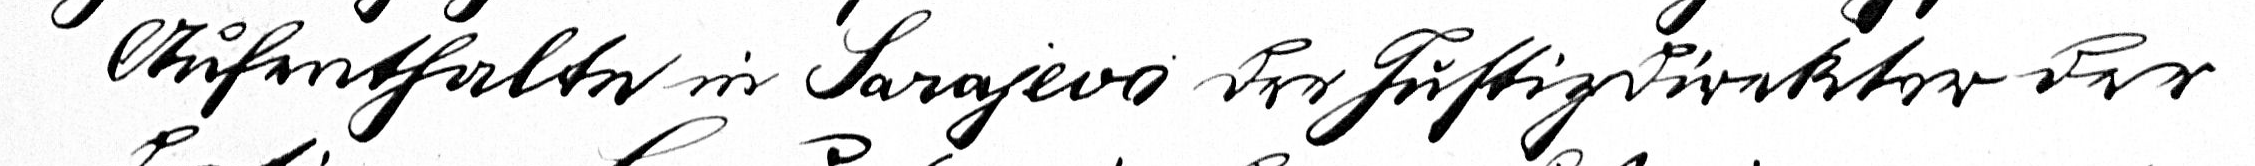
Aufenthalte in Sarajevo der Justizdirektor der
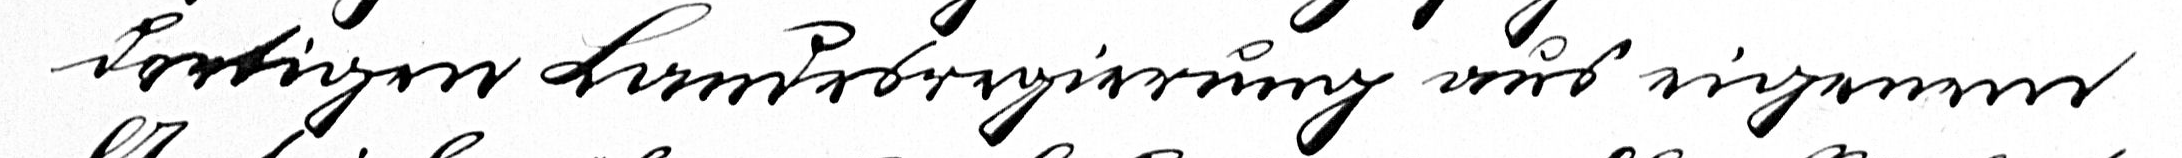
dortigen Landesregierung aus eigenem
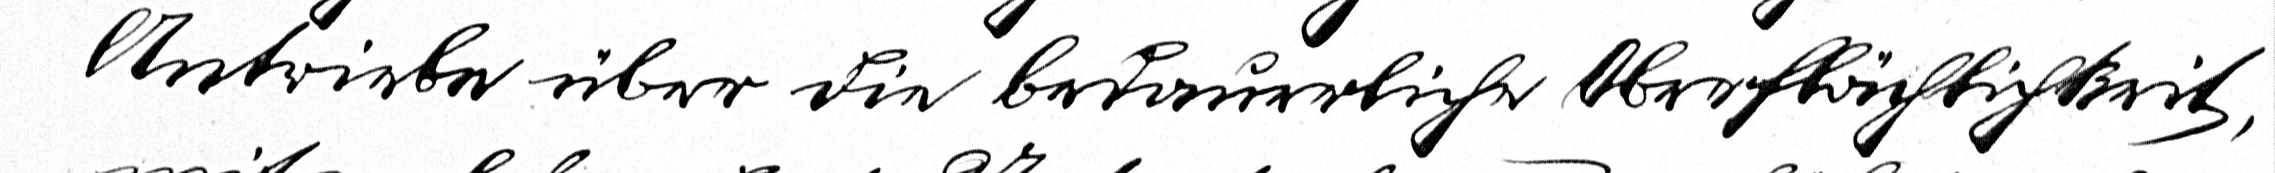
Antriebe über die bedauerliche Oberflüchtigkeit,
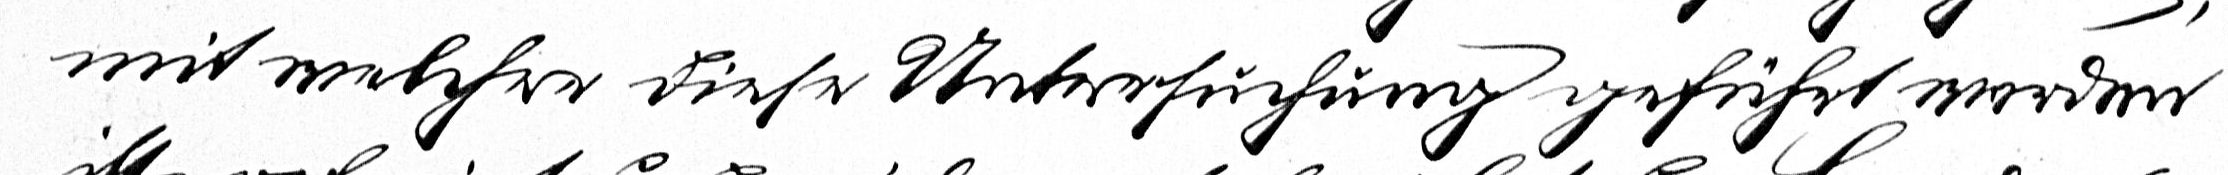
mit welcher diese Untersuchung geführt worden
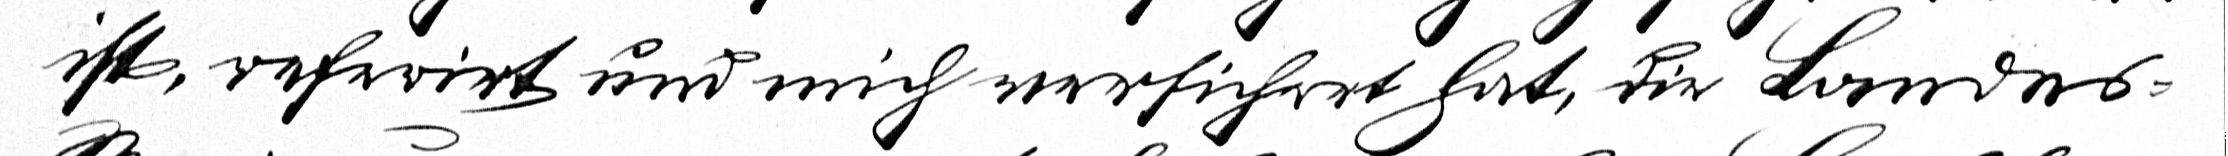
ist, referirt und mich versichert hat, die Landes-
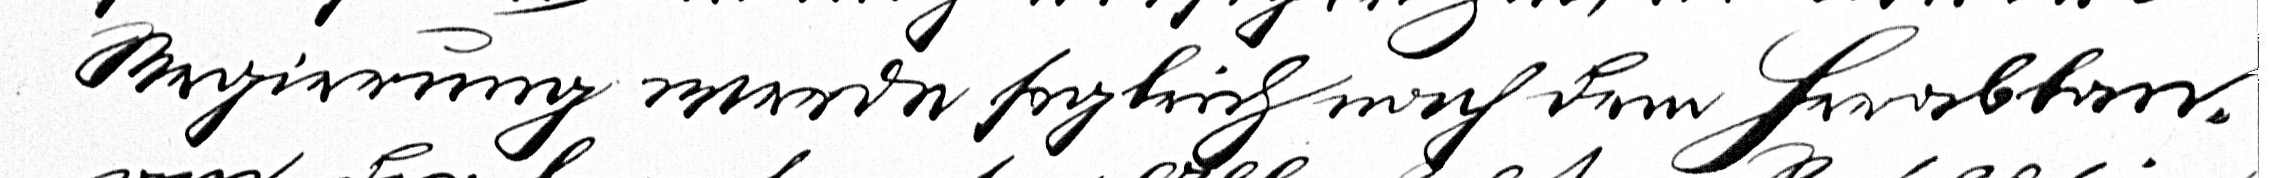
Regierung werde sogleich nach dem herabban¬
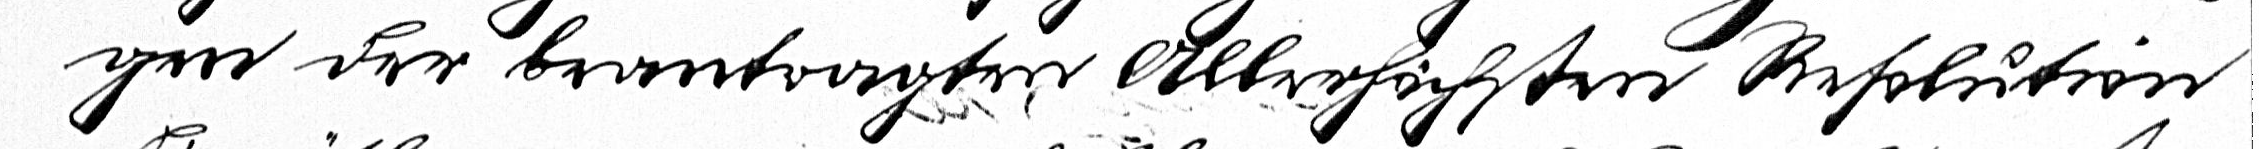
gen der beantragten Allerhöchsten Resolution
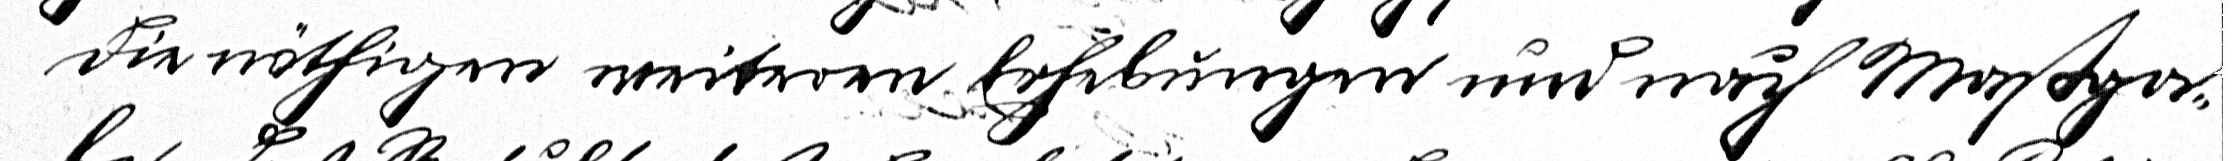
die nöthigen weiteren Erhebungen und nach Maßga¬
